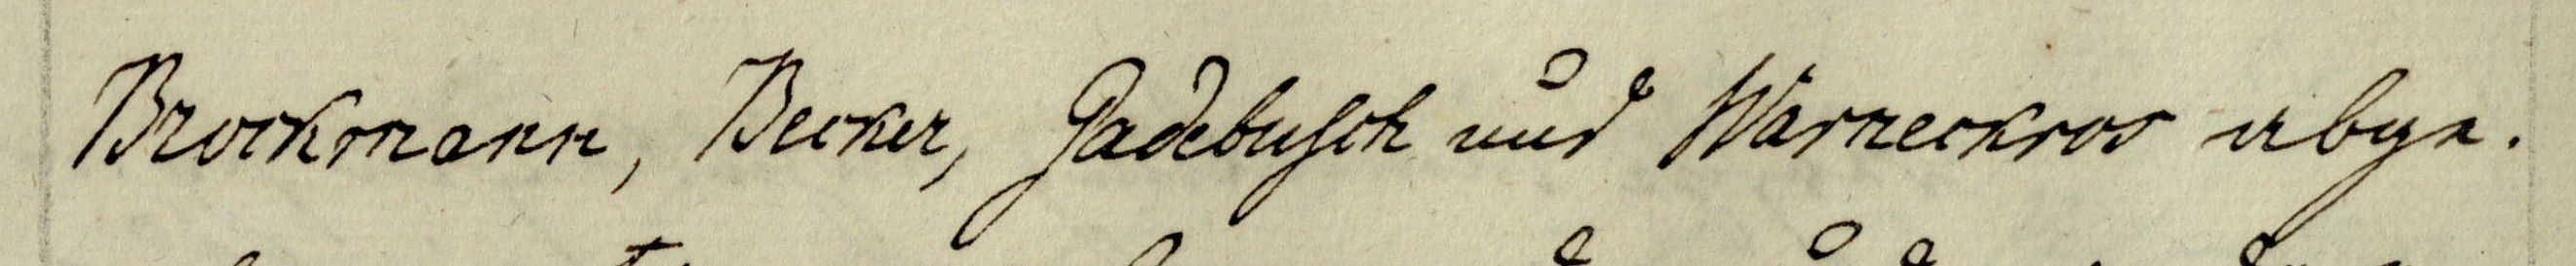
Brockmann, Becker, Gadebusch und Warneckros abge¬
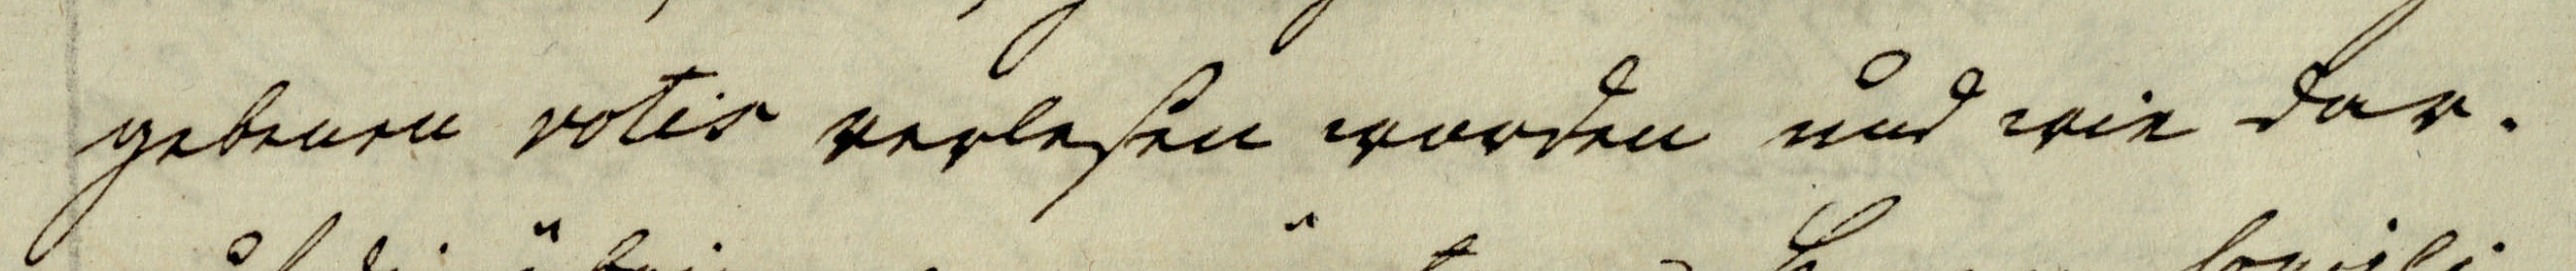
gebenen votis verlesen worden und wie dar¬
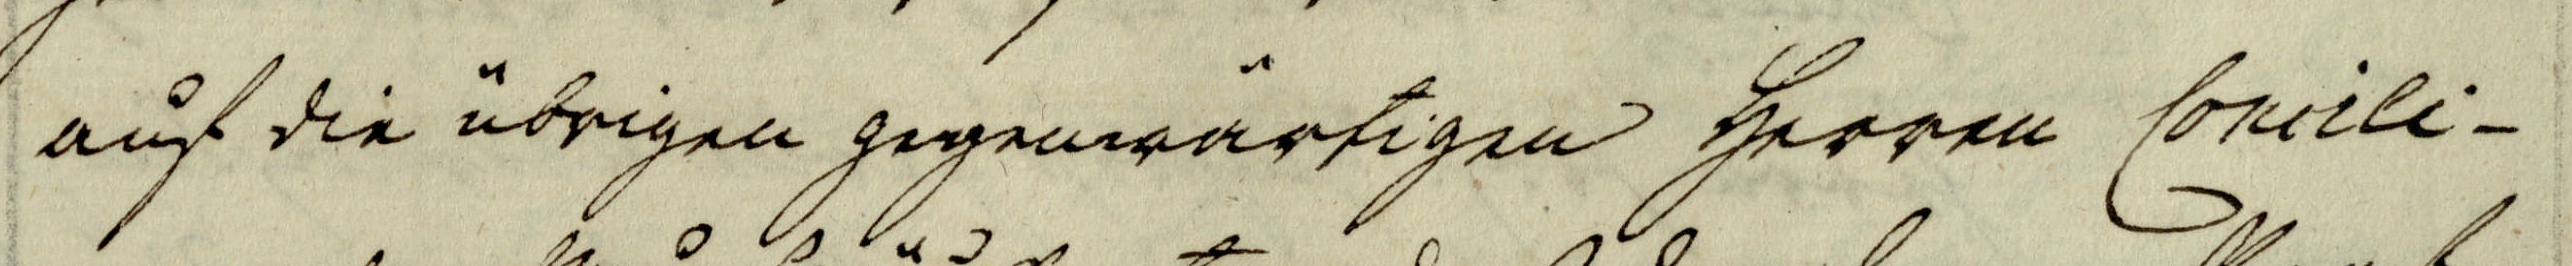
auf die übrigen gegenwärtigen Herren Concili¬
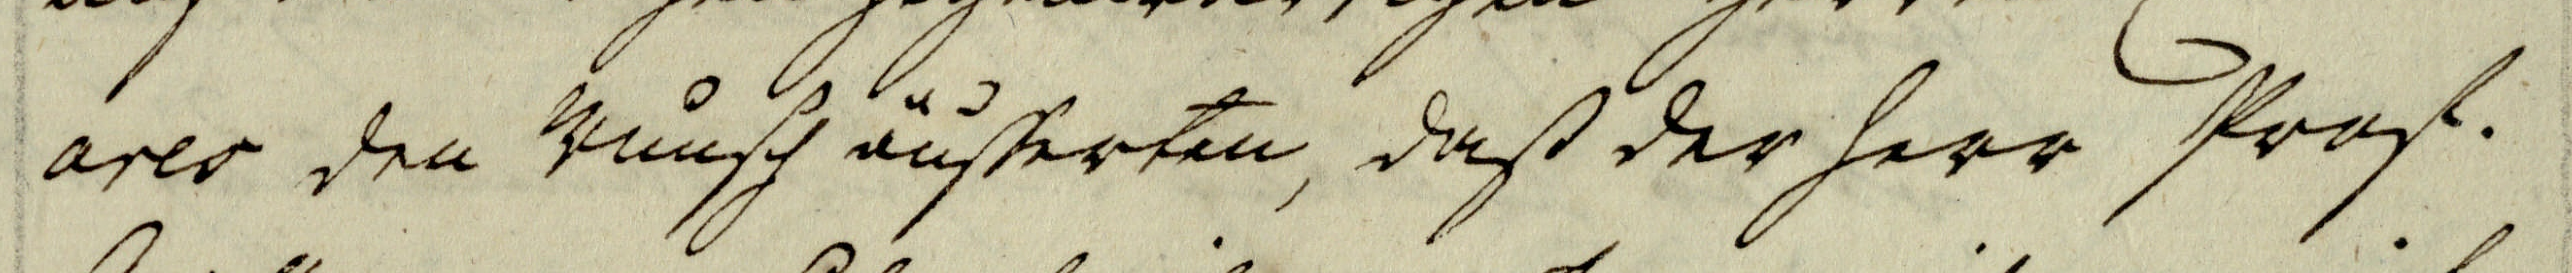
ares den Wunsch äusserten, daß der Herr Prof.
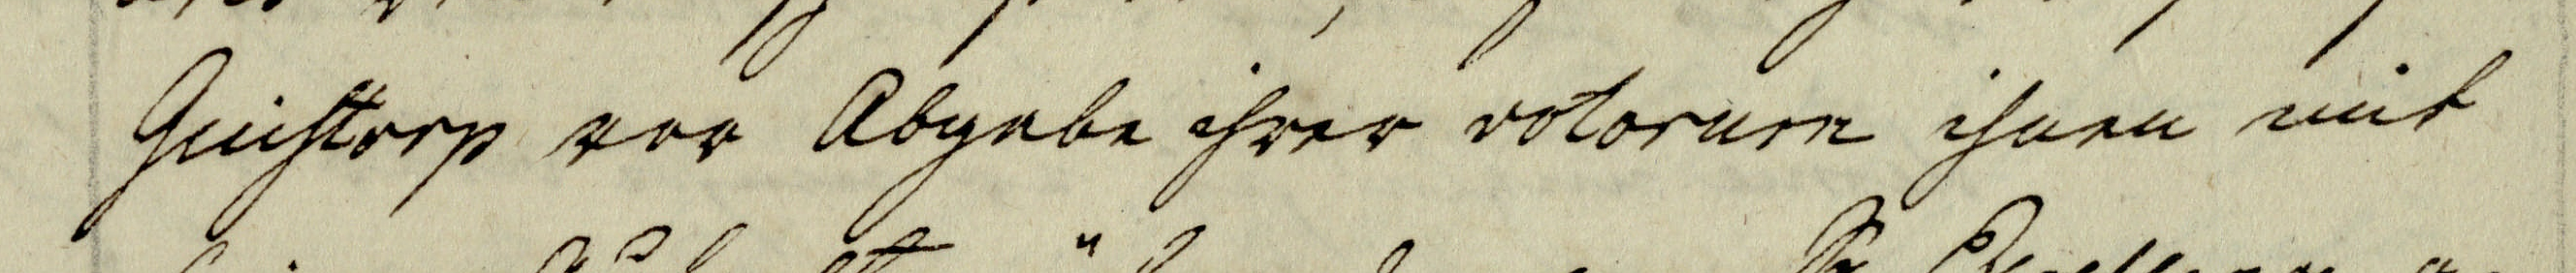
Quistorp vor Abgabe ihrer votorum ihnen mit
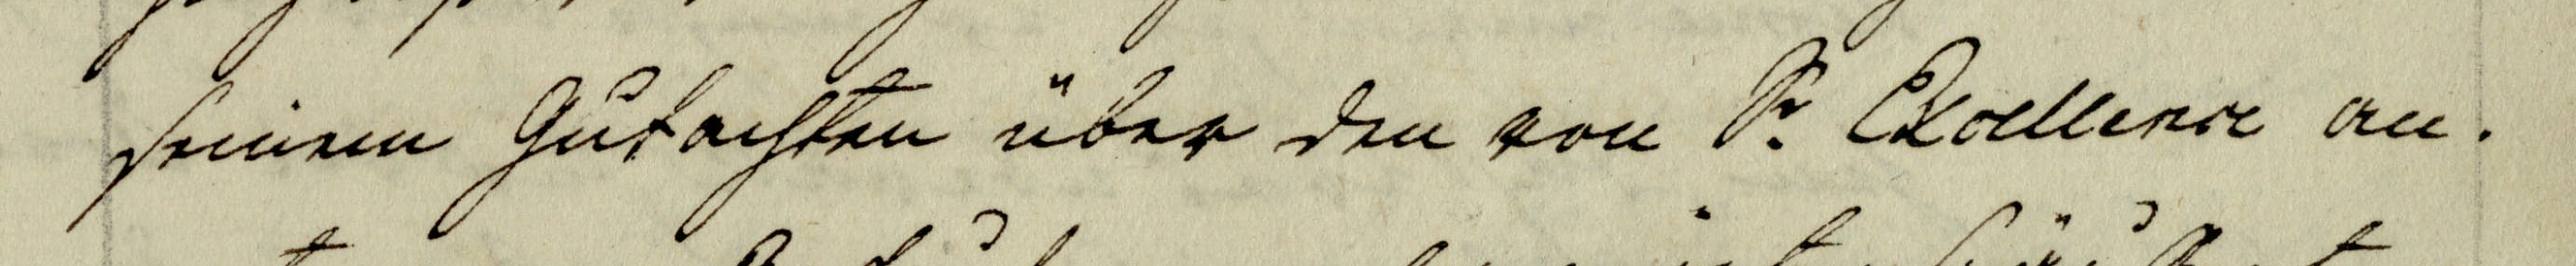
seinem Gutachten über den von Sr Excellence an¬
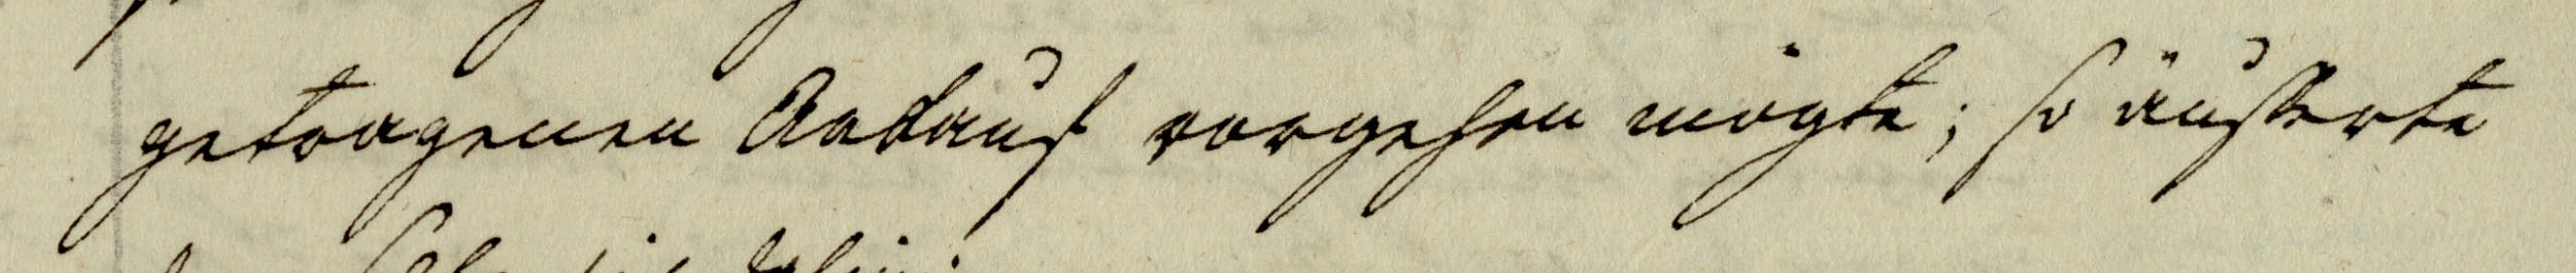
getragenen Ankauf vorgehen mögte; so äusserte
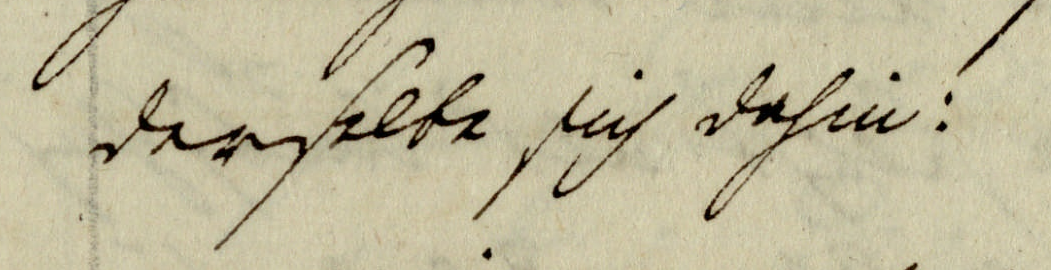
derselbe sich dahin:
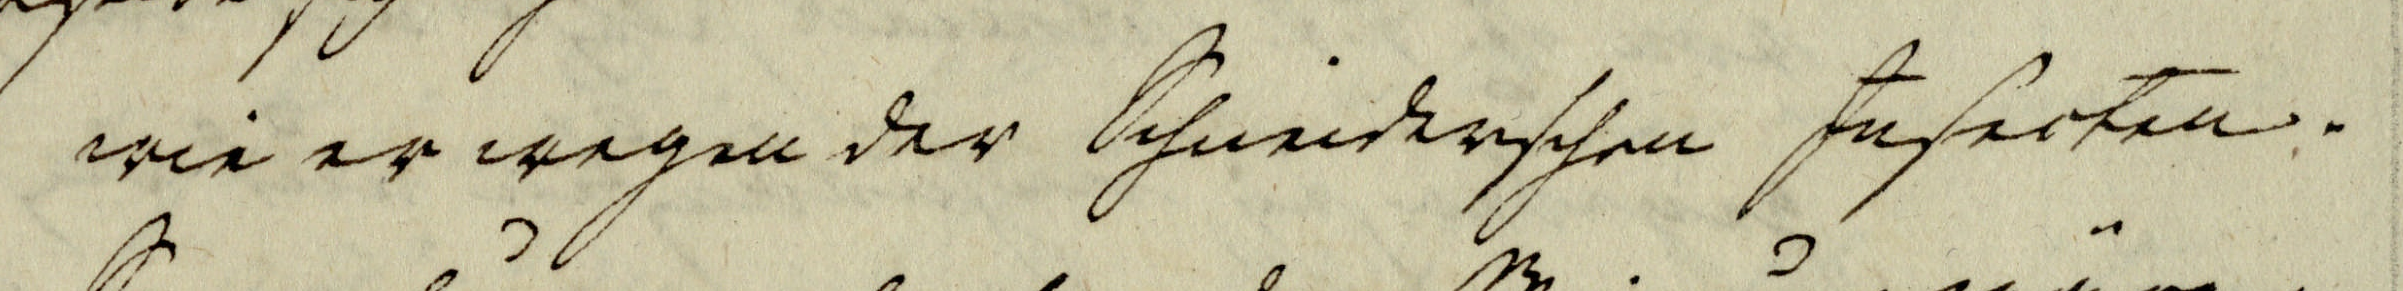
wie er wegen der Schneiderschen Insecten¬
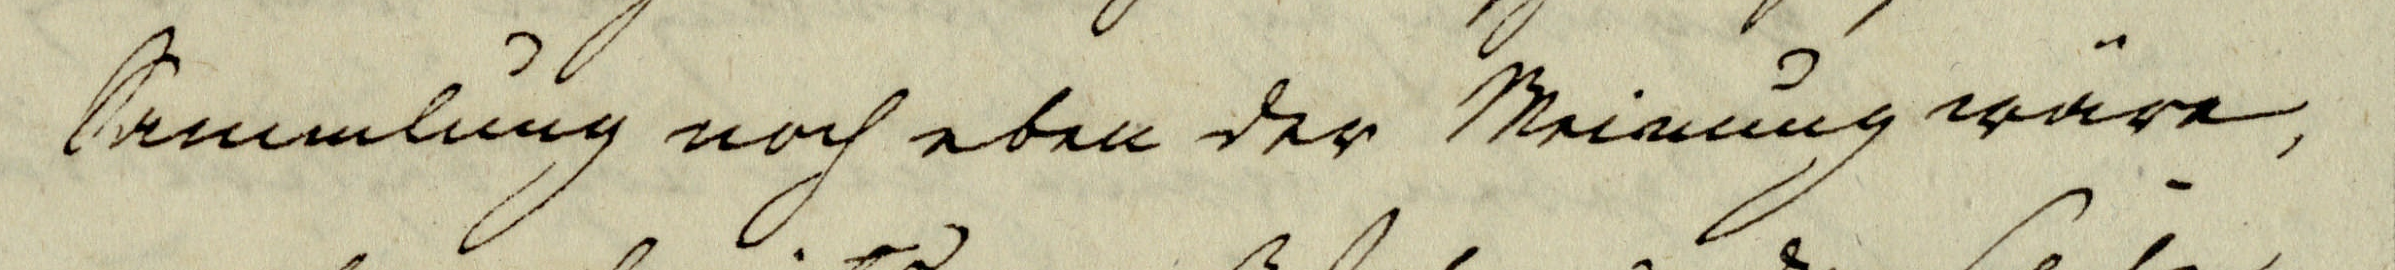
Sammlung noch eben der Meinung wäre,
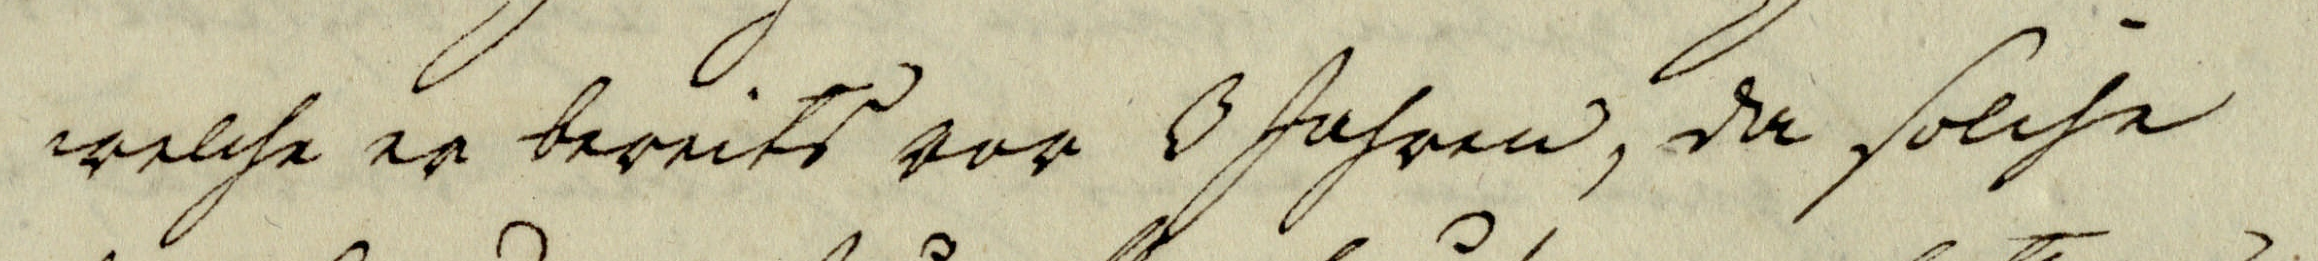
welche er bereits vor 3 Jahren, da solche
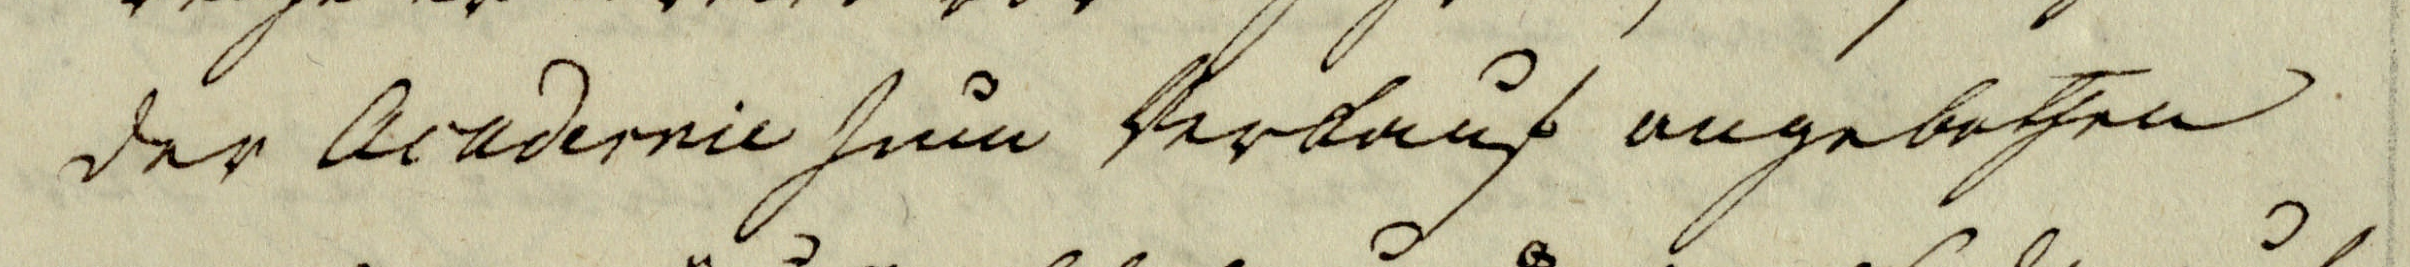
der Academie zum Verkauf angebothen
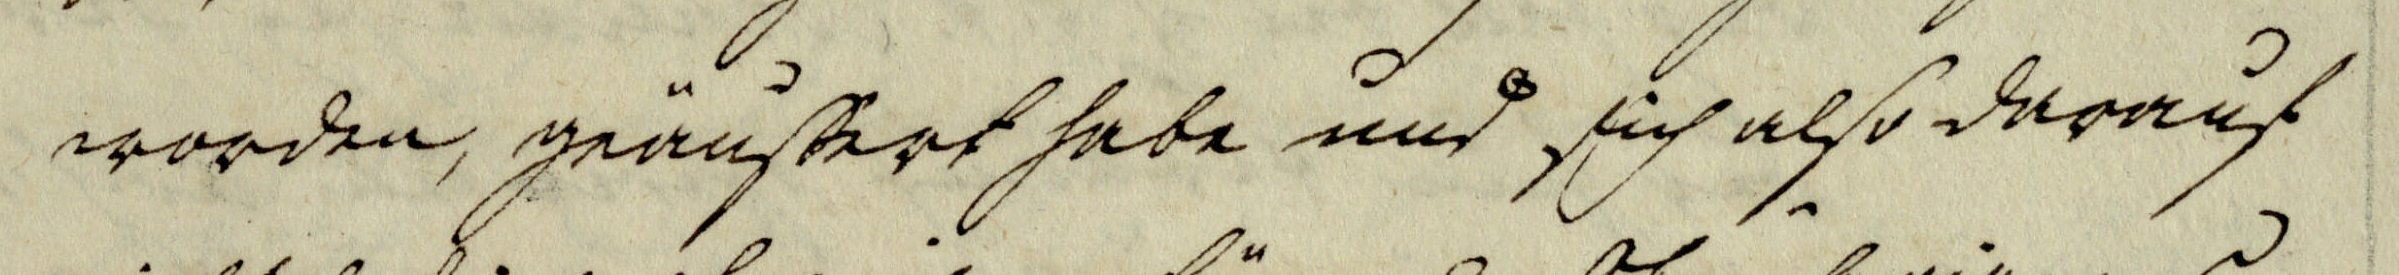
worden, geäussert habe und sich also darauf
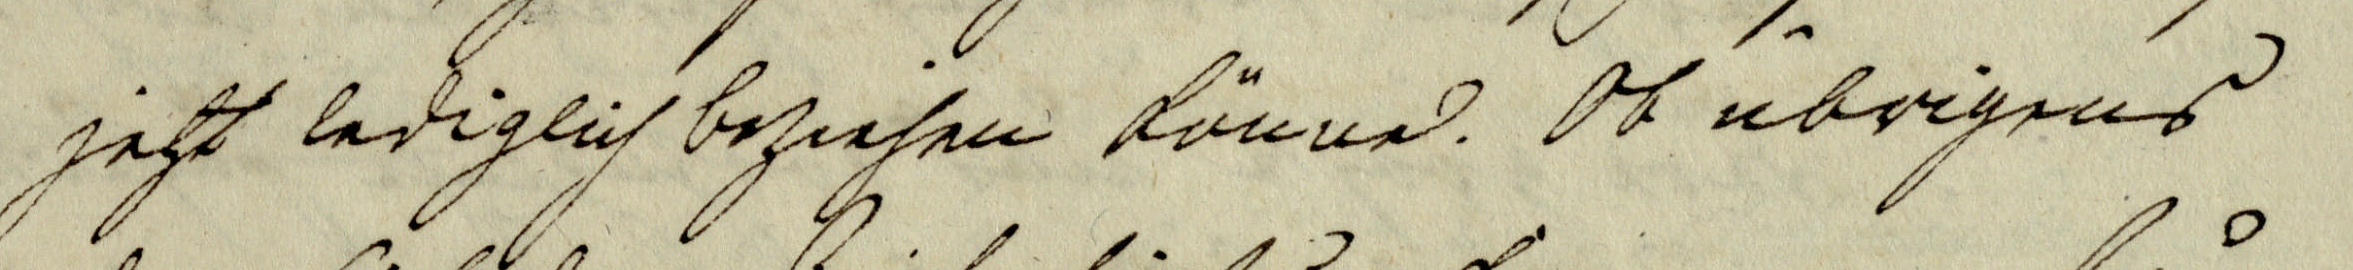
jetzt lediglich beziehen könne. Ob übrigens
